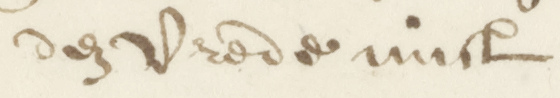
den Vrede mist
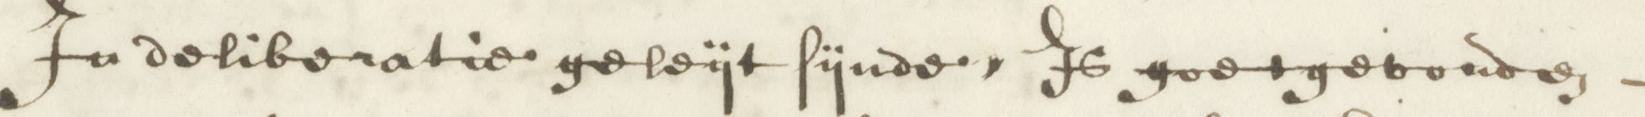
In deliberatie geleijt sijnde, Is goetgevonden
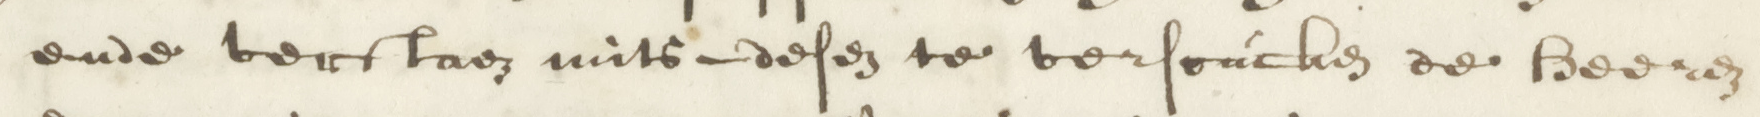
ende verstaen mits-desen te versoucken de Heeren
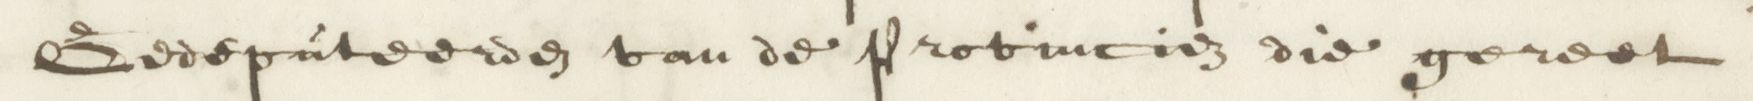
Gedeputeerden van de Provincien die gereet
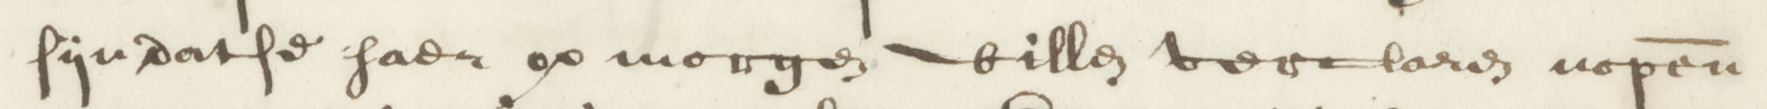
sijn datse haer op morgen willen verclaren nopen
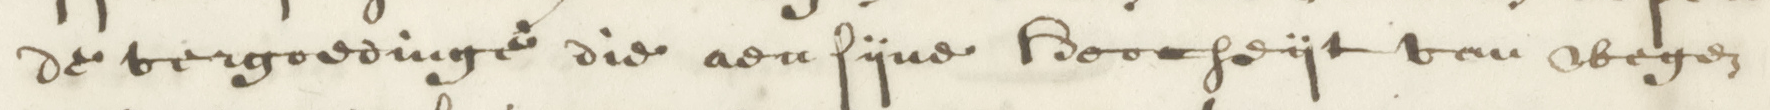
de vergoedinge die aen sijne Hoocheijt van wegen
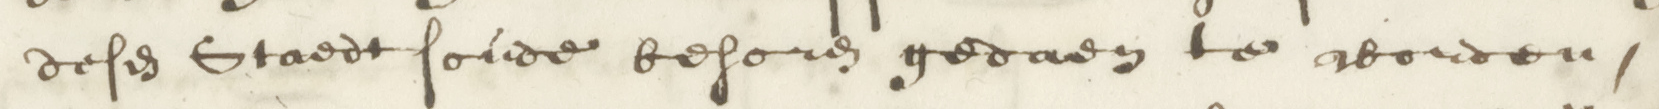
desen Staedt soude behoren gedaen te worden,
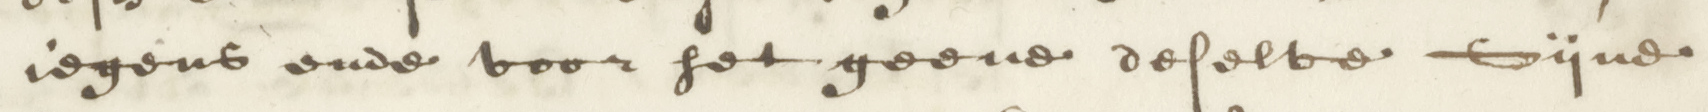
iegens ende voor het geene deselve Sijne
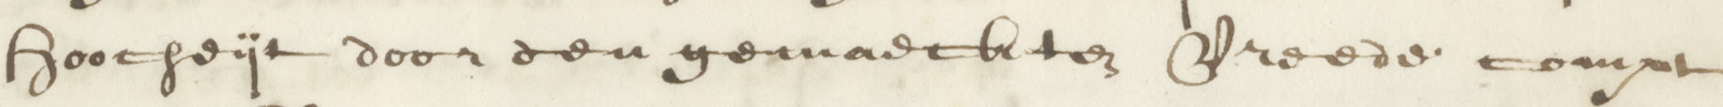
Hoocheijt door den gemaeckten Vreede compt
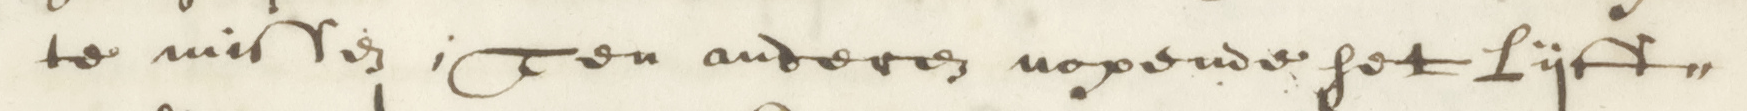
te missen; Ten anderen nopende het Lijff„
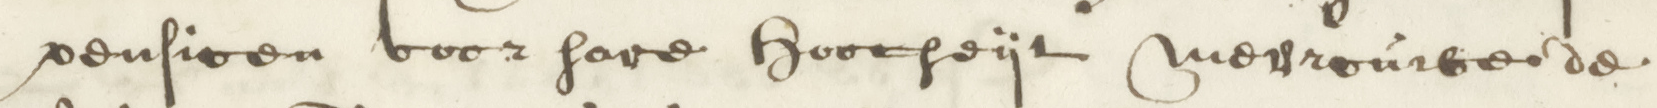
pensioen voor hare Hoocheijt mevrouwe de
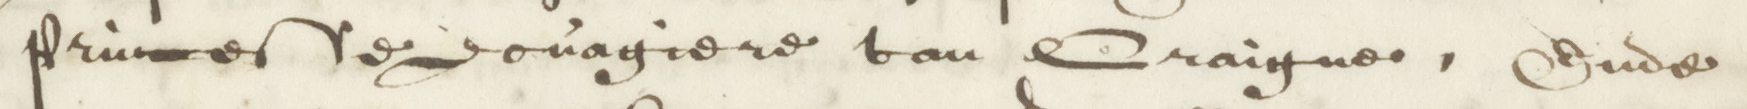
Princesse douagiere van Oraigne. Ende
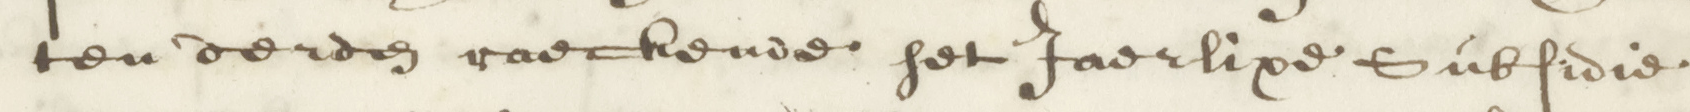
ten derden raeckende het Jaerlixe Subsidie
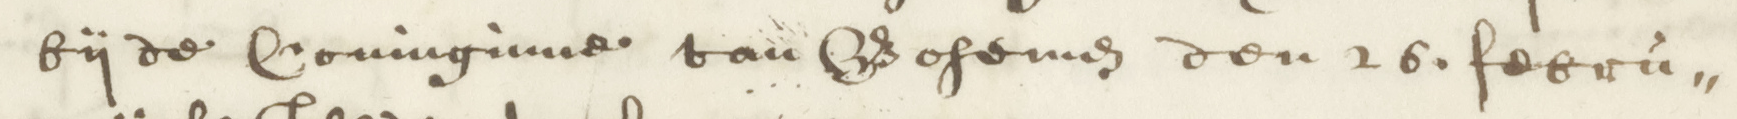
bij de Coninginne van Bohemen den 26. febru„
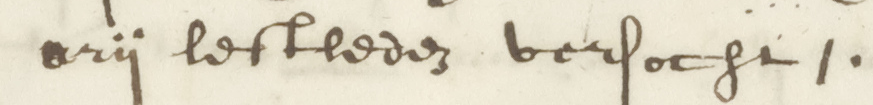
arij lestleden, versocht.
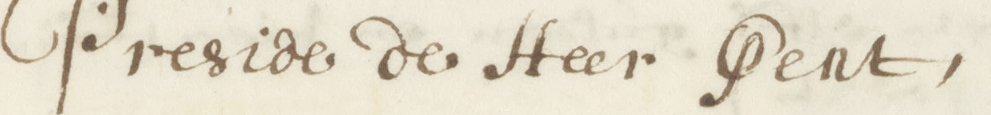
Preside de Heer Gent,
